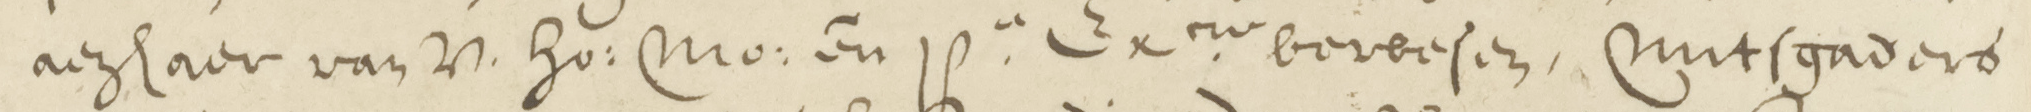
aen haer van U. ho:Mo: en Pe. Excie. bewesen, mitsgaders
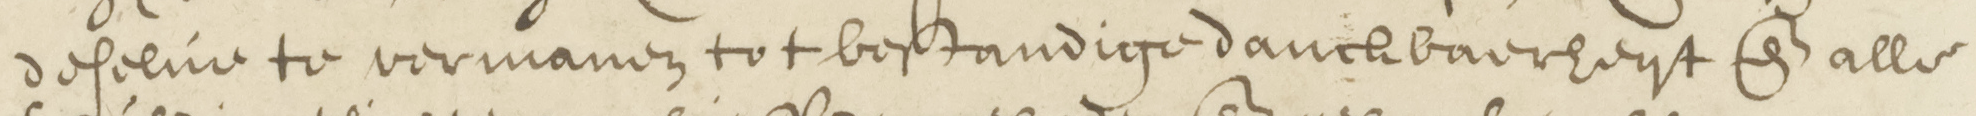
deselue te vermanen tot bestandige danckbaerheyt & alle
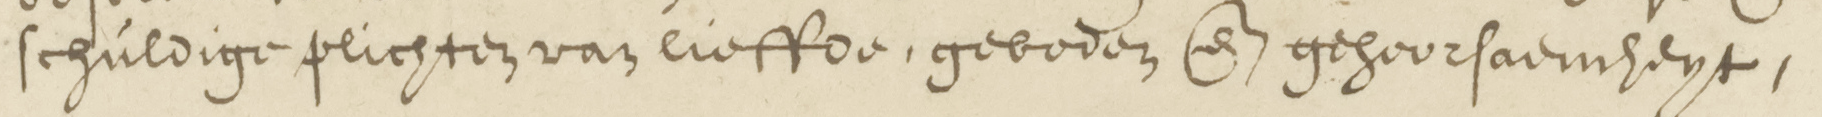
schuldige plichten van lieffde, geboden & gehoorsaemheyt.
